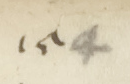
154
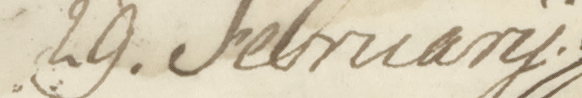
29. Februarij.
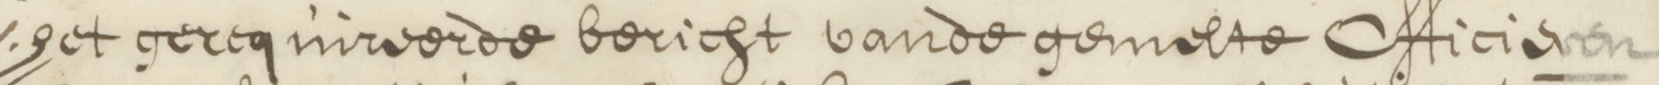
het gerequireerde bericht van de gemelte Officieren
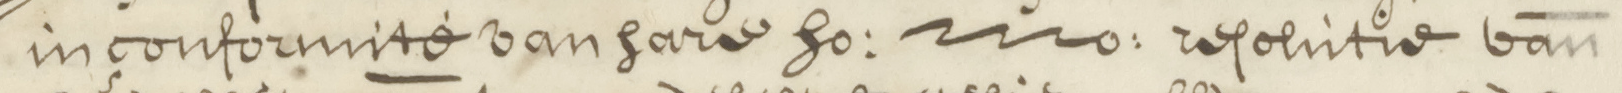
in conformité van hare ho:Mo: resolutie van
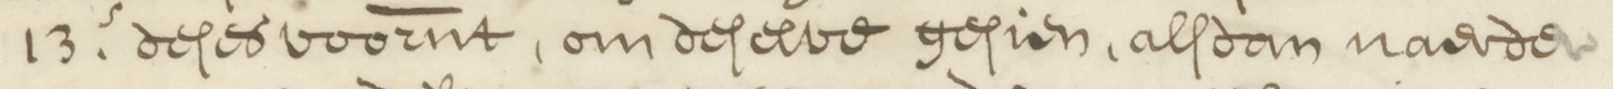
13e. deses voornt, om deselve gesien, alsdan naerder
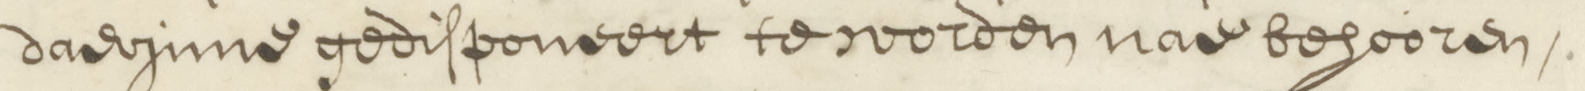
daerinne gedisponeert te worden nae behooren.
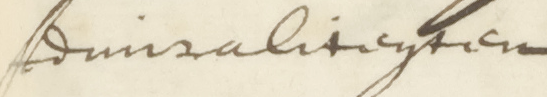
Admiraliteyten
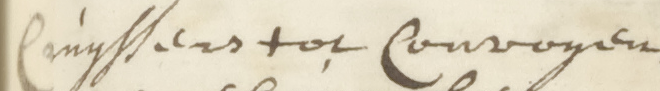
Cruyssers tot Convoyen
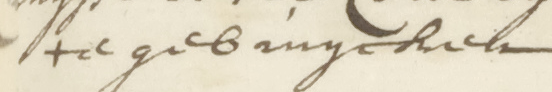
te gebruycken
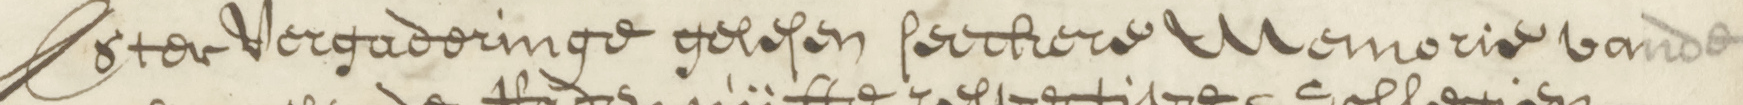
Is ter Vergaderinge gelesen seeckere Memorie vande
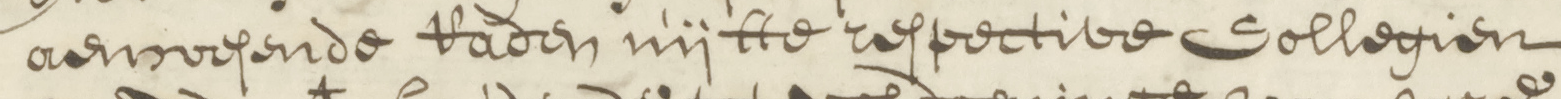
aenwesende Raden uijtte respective Collegien
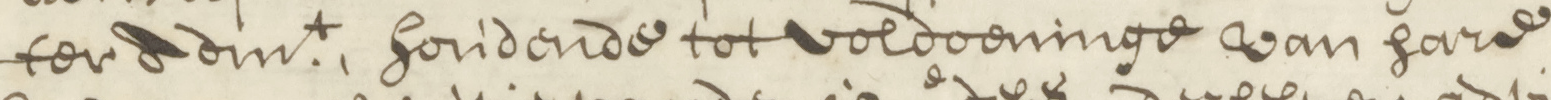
ter Admt., houdende tot voldoeninge van hare
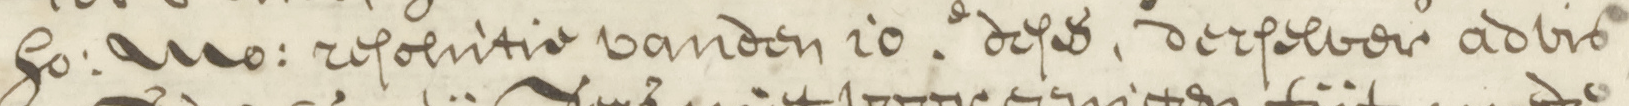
ho:Mo: resolutie van den 10e. deses, derselver advis
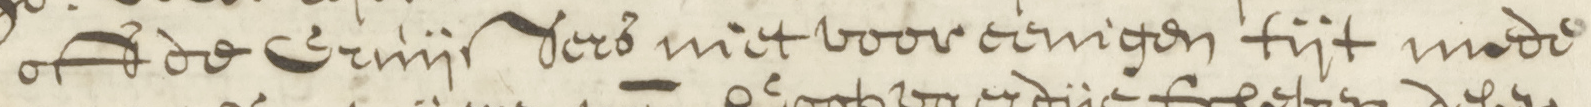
off de Cruijssers niet voor eenigen tijt mede
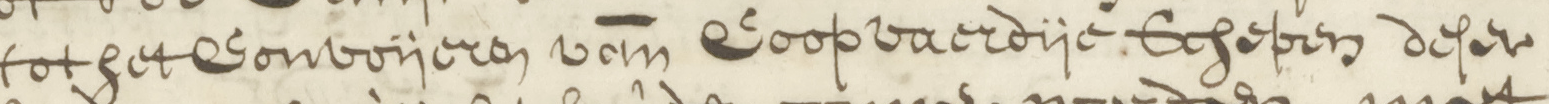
tot het Convoijeren van Coopvaerdije Schepen deser
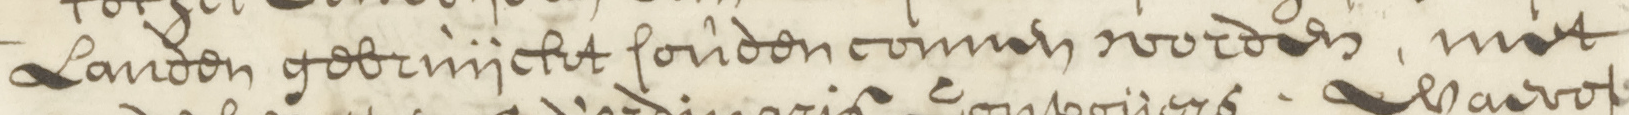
Landen gebruijckt souden connen worden, met
